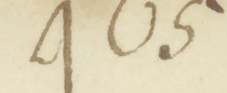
465
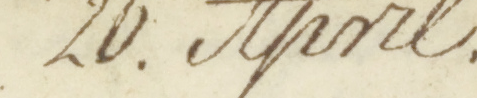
26. April.
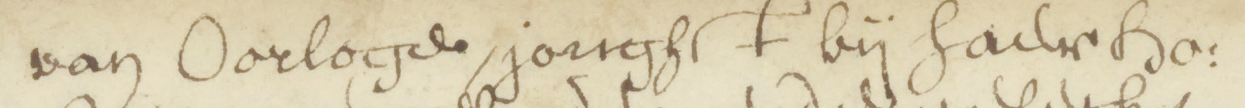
van Oorloge, jonghst bij haer Ho:
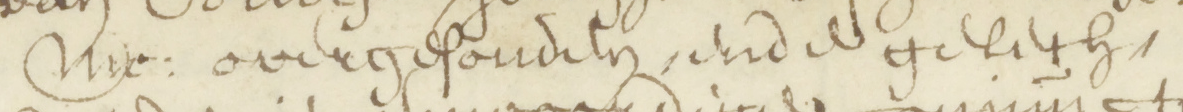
Mo: overgesonden, ende geleth,
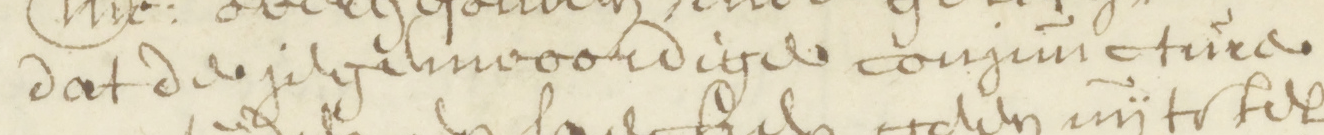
dat de jegenwoordige conjuncture
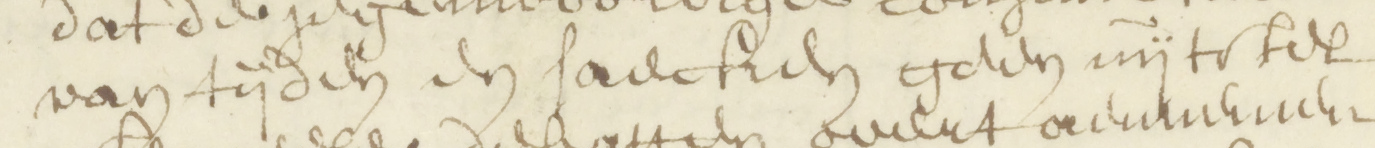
van tijden en saecken geen uijtstel
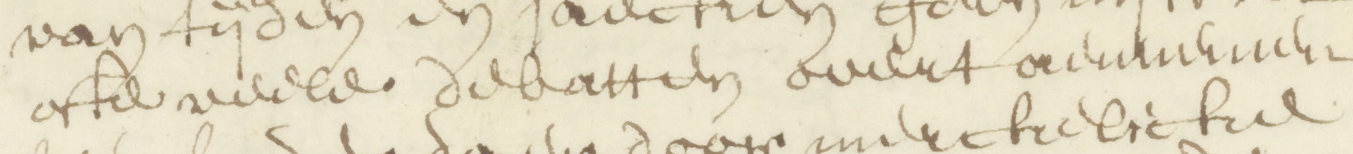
ofte veele debatten overt aennemen
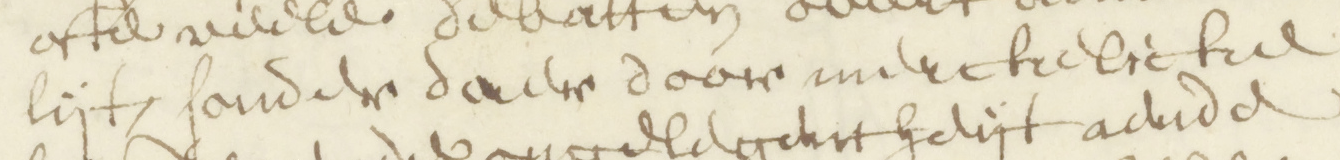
lijt, sonder daer door merckelicke
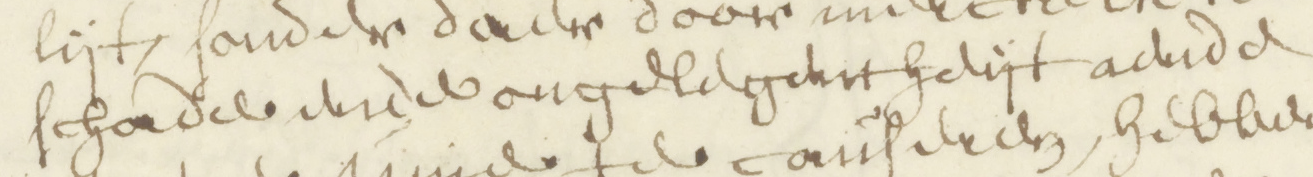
schade ende ongelegentheijt aende
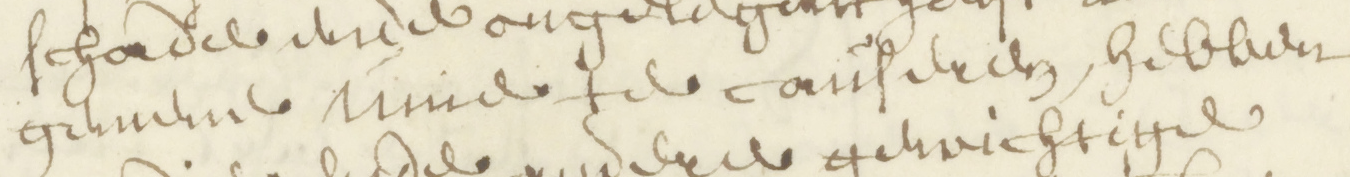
gemene Unie te causeren, hebben
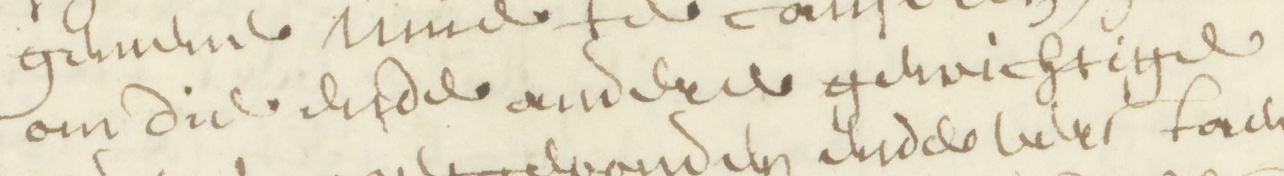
om die ende andere gewichtige
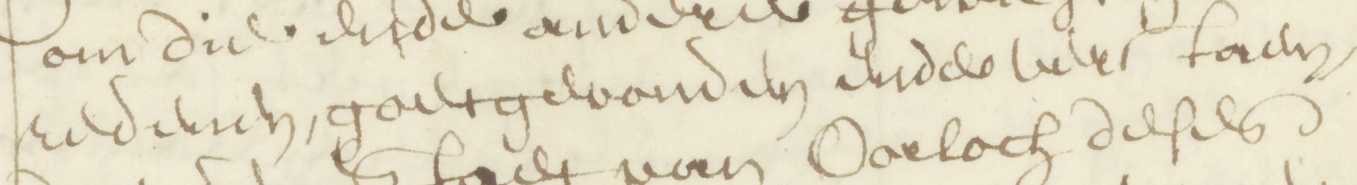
redenen, goetgevonden ende verstaen,
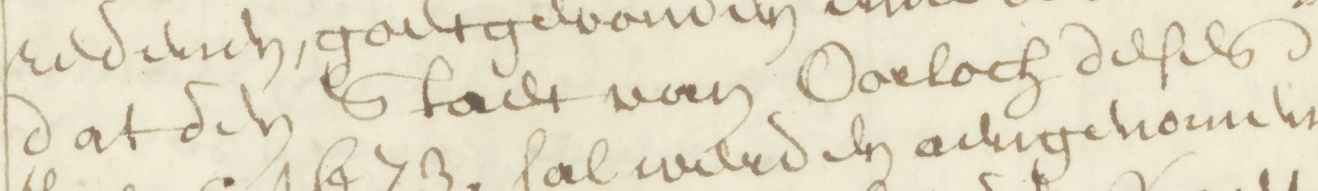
dat den Staet van Oorloch dese
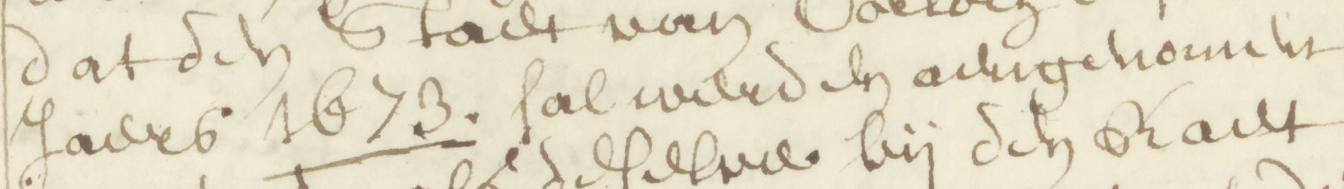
Jaers 1673. sal werden aengenomen
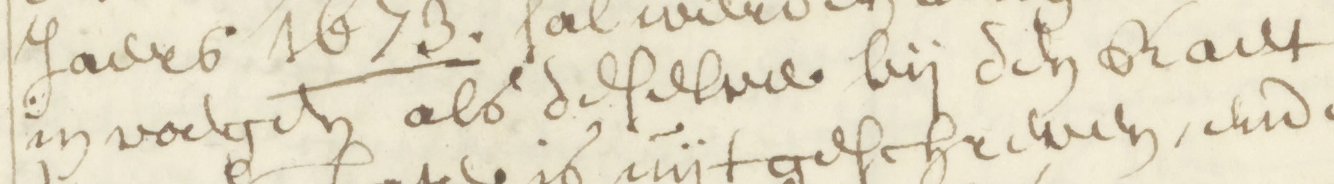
in voegen als deselve bij den Raet
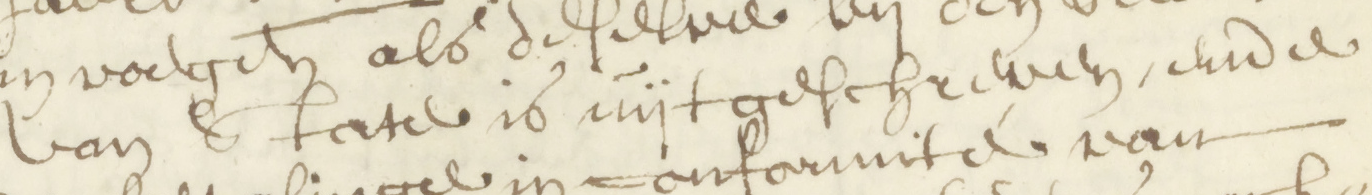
van State is uijtgeschreven, ende
